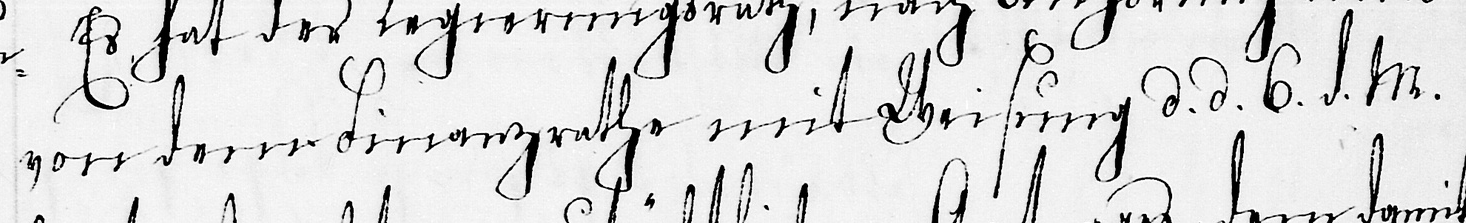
von dem Finanzrathe mit Weisung d. d. 6. d. M.
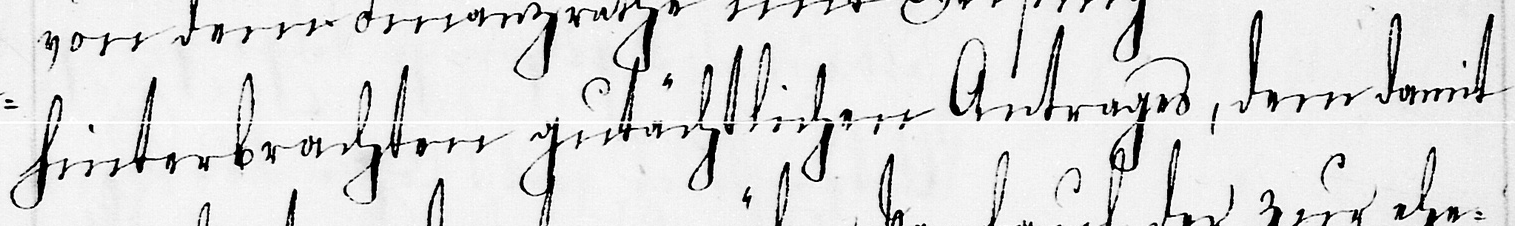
hinterbrachten gutächtlichen Antrages, dem damit
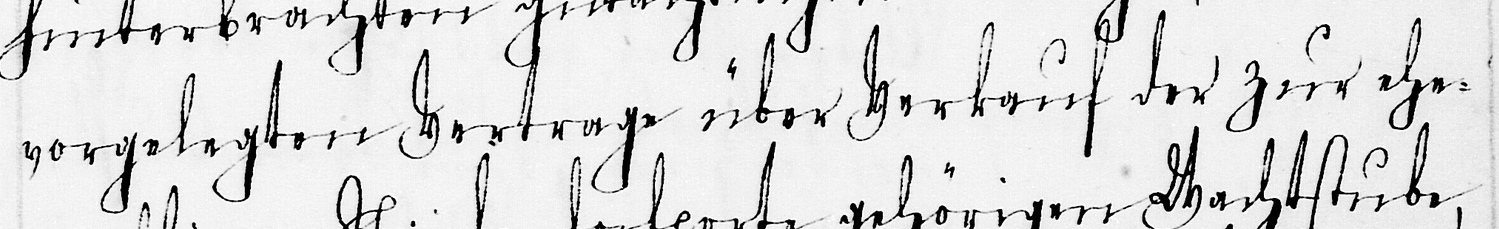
vorgelegten Vertrage über Verkauf der zur ehe¬
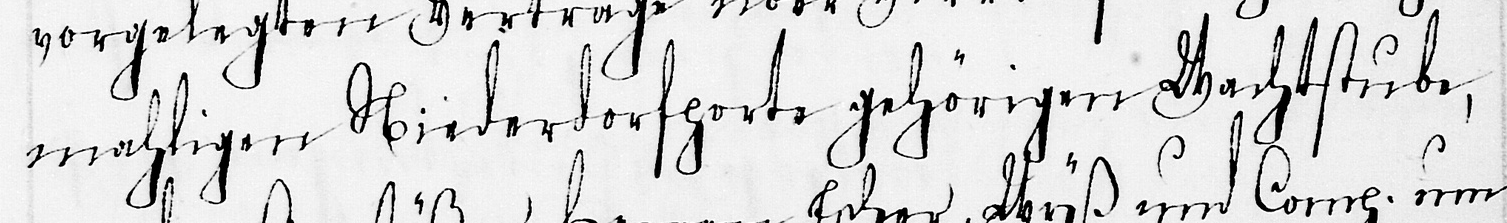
mahligen Niederdorfporte gehörigen Wachtstube,
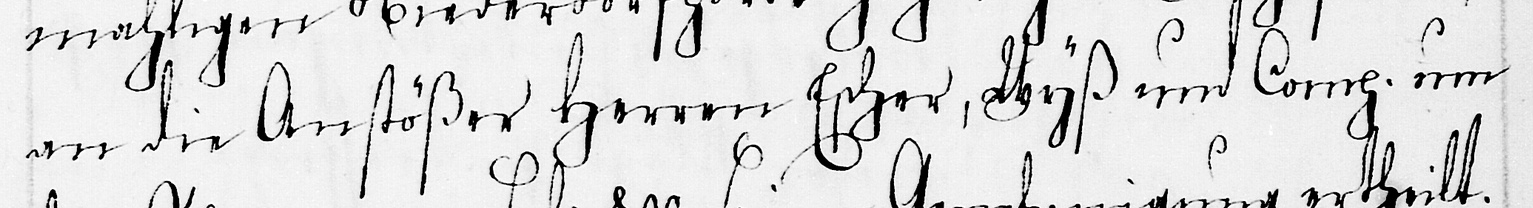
an die Anstößer Herren Escher, Wyß und Comp. um
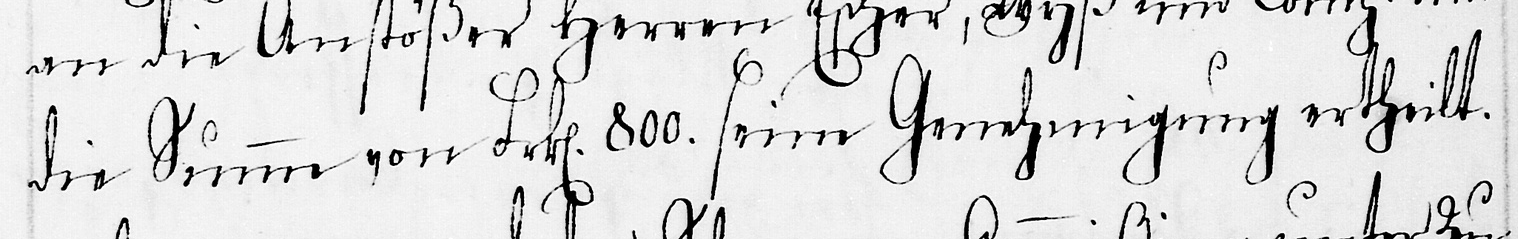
die Summe von Frk[en]. 800. seine Genehmigung ertheilt.
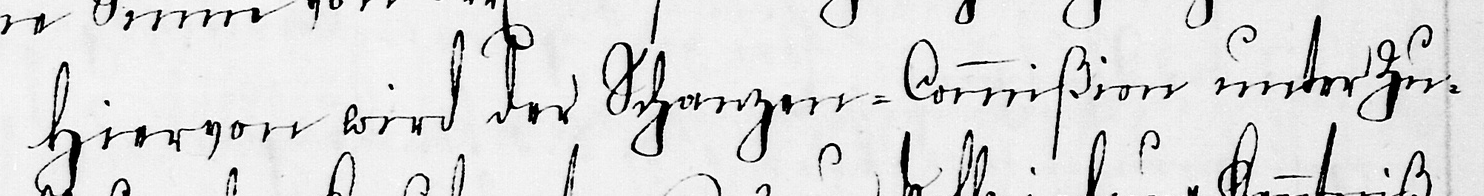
Hiervon wird der Schanzen-Commißion unter Zu¬
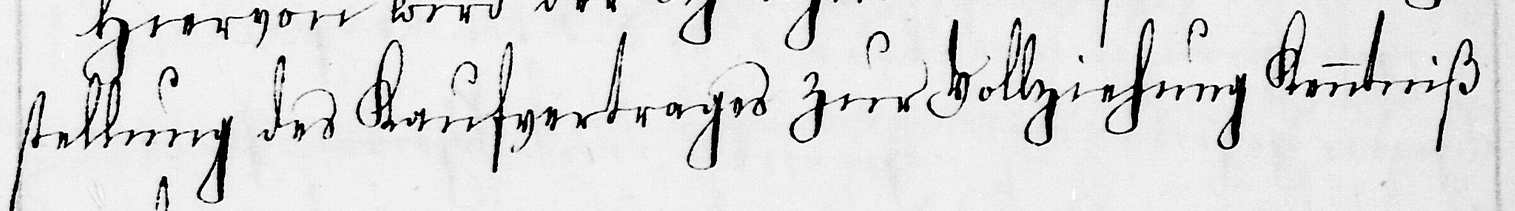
stellung des Kaufvertrages zur Vollziehung Kenntniß
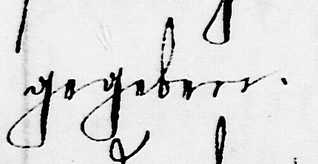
gegeben.
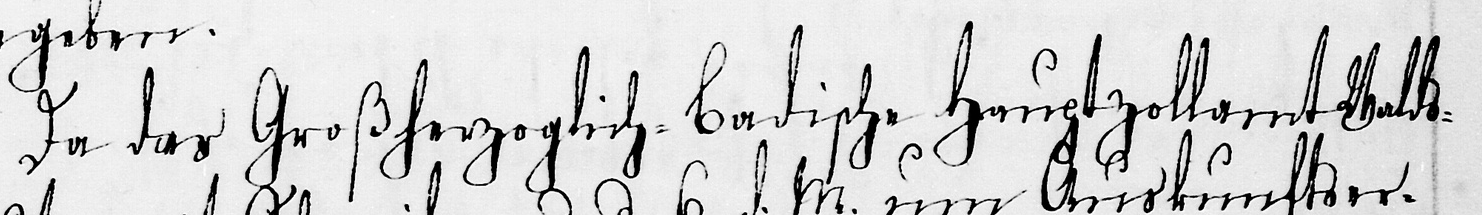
Da das Großherzoglich-Badische Hauptzollamt Walds¬
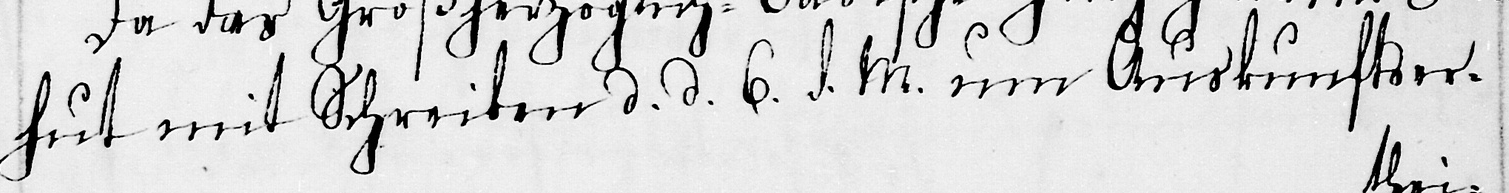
hut mit Schreiben d. d. 6. d. M. um Auskunftser-
